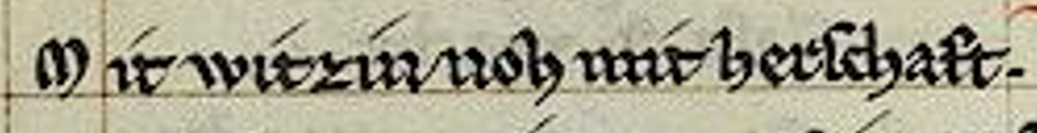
Mit witzin noh mit herſchaft.
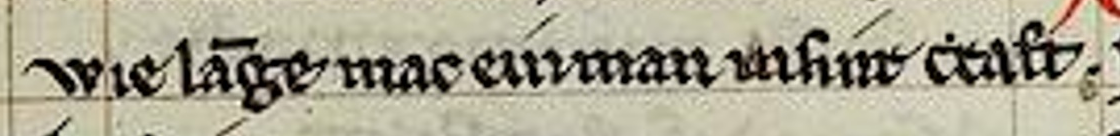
Wie la(n)ge mac ein man inſinr craft.
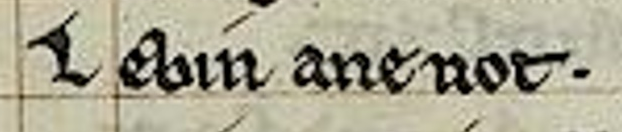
Lebin ane not.
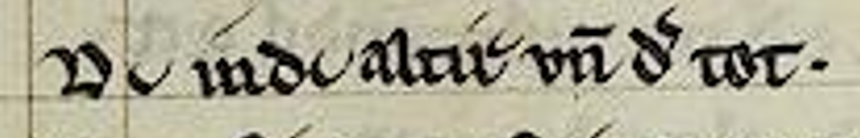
D(az) ind(az) altir vn(d) d(er) tot.
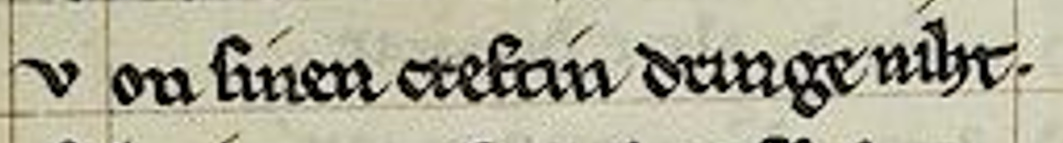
Von ſinen creftin dringe niht.
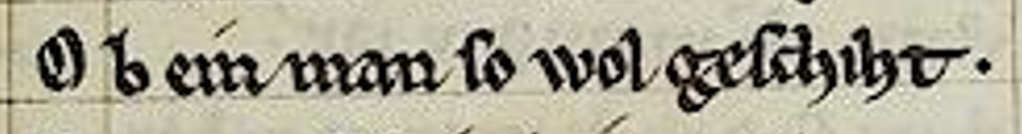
Ob ein man ſo wol geſchiht.
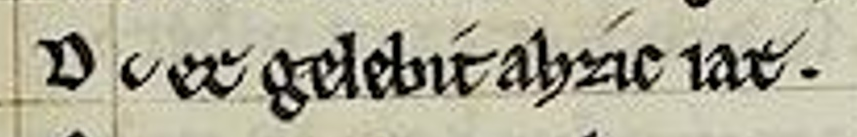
D(az) er gelebit ahzic iar.
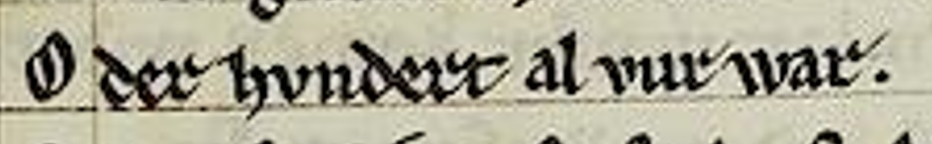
Oder hundert al vur war.
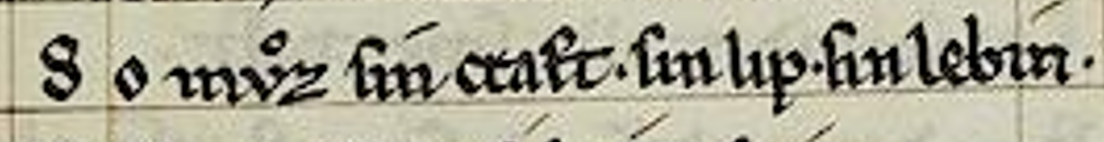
So mv°oz ſin craft. ſin lip. ſin lebin.
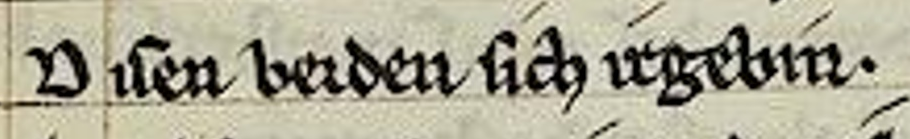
Diſen beiden ſich irgebin.
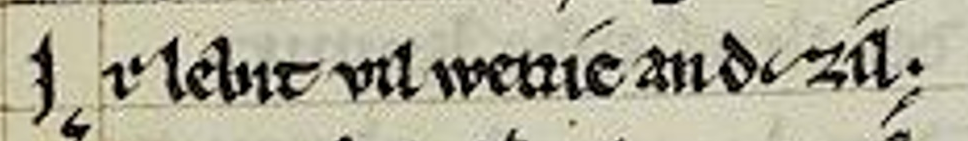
Ir lebit vil wenic an d(az) zil.
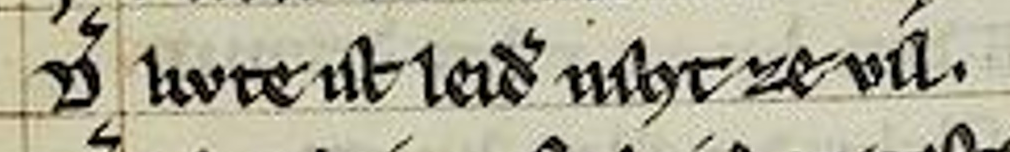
D(er) livte iſt leid(er) niht ze vil.
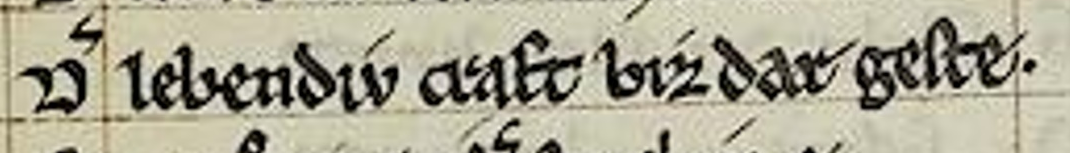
D(er) lebendiv craft biz dar geſte.
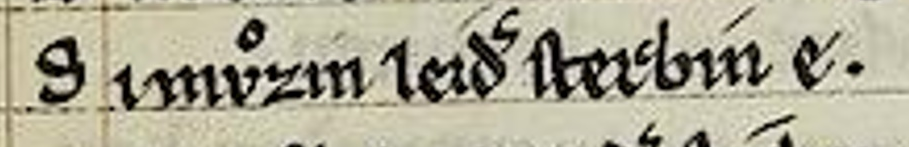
Si mv°ozin leid(er) ſterbin e.
